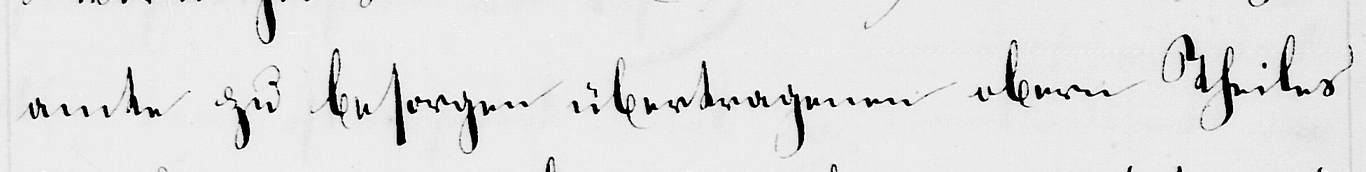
amte zu besorgen übertragenen obern Theiles
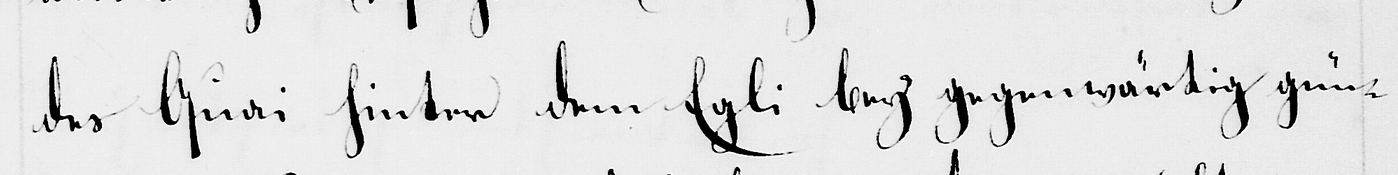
des Quai hinter dem Egli bey gegenwärtig gün¬
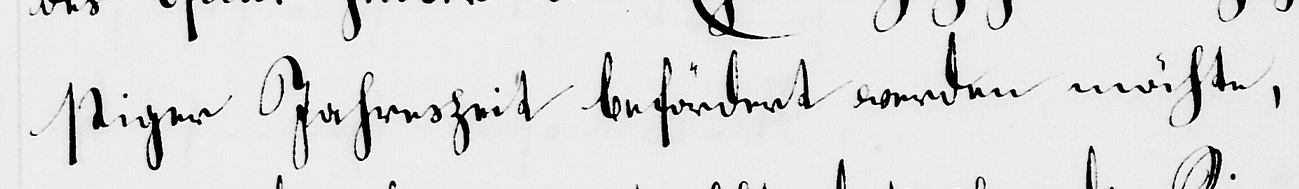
stiger Jahreszeit befördert werden möchte,
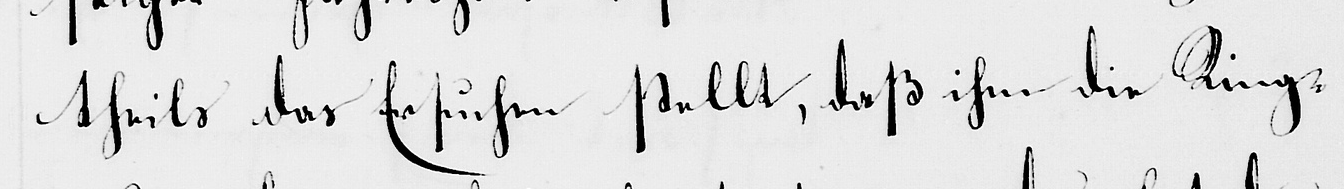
theils das Ersuchen stellt, daß ihm die Ring¬
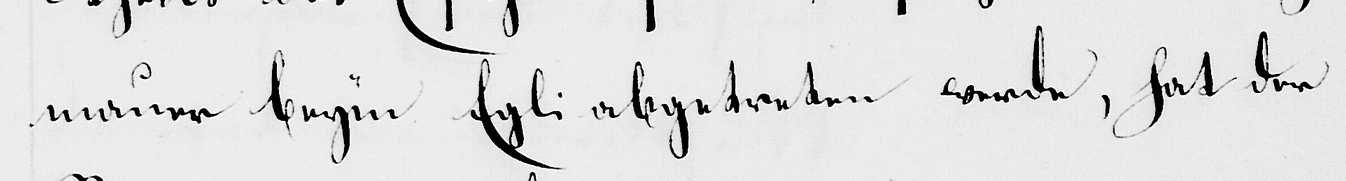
mauer beym Egli abgetreten werde, hat der
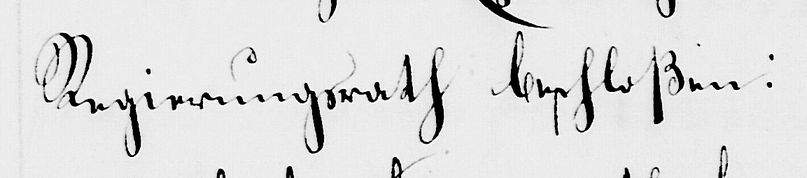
Regierungsrath beschloßen:
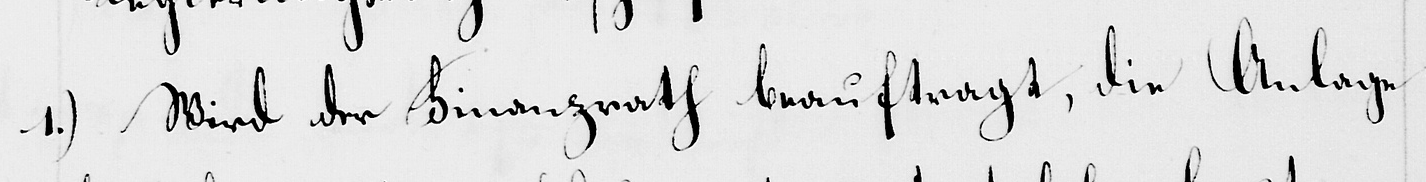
1.) Wird der Finanzrath beauftragt, die Anlage
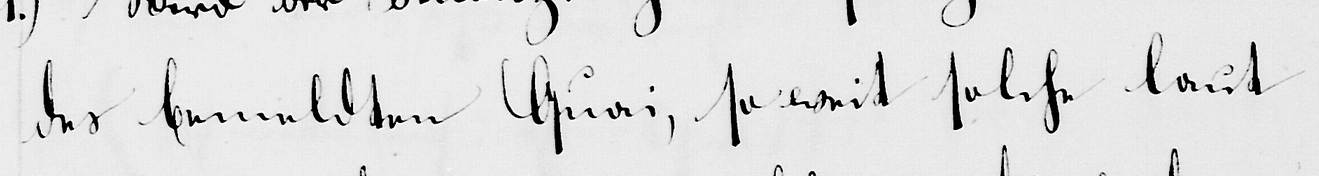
des bemeldten Quai, so weit solche laut
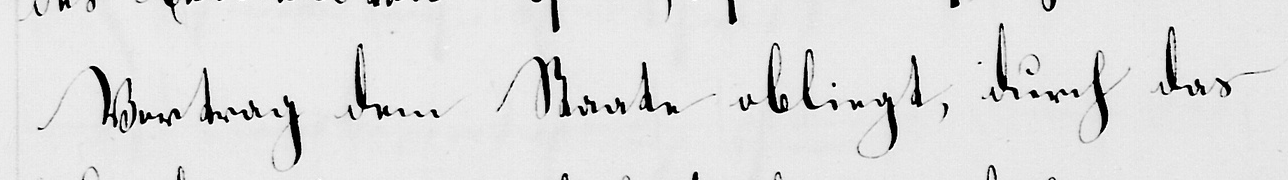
Vertrag dem Staate obliegt, durch das
